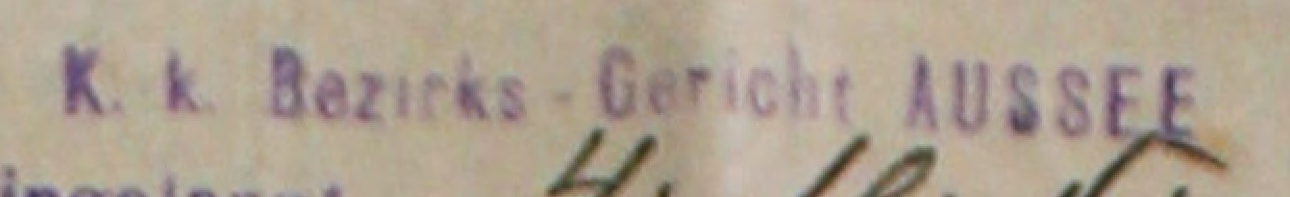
K. k. Bezirks - Gericht AUSSEE
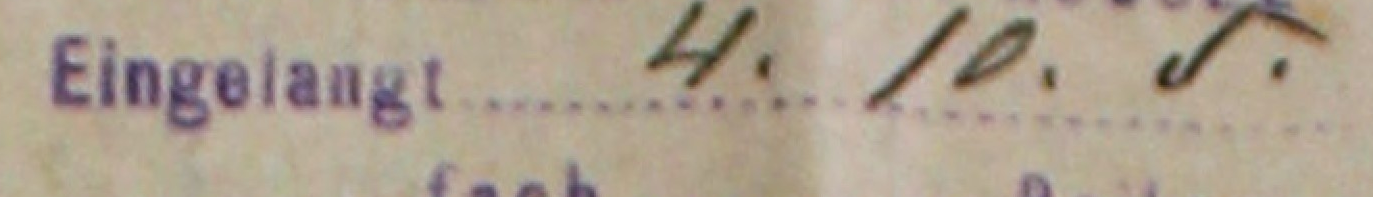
Eingelangt 4.10.5.
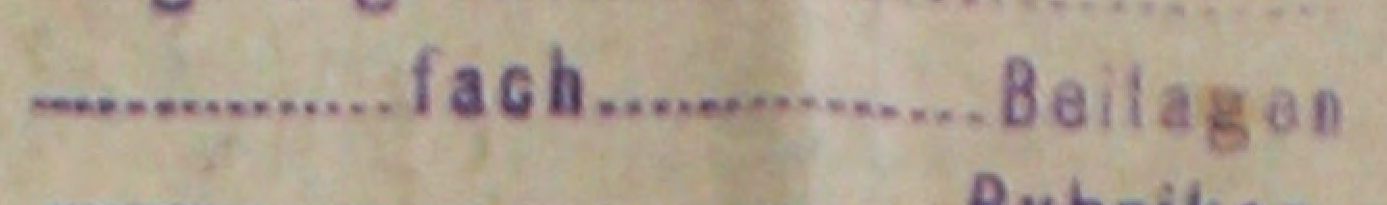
......... fach ............ Beilagen
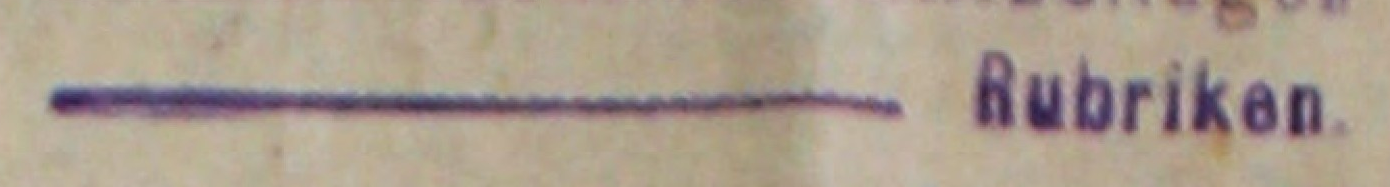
.......................... Rubriken.
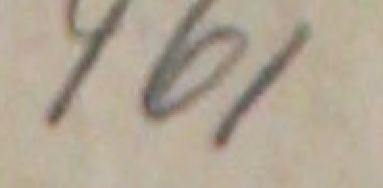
461
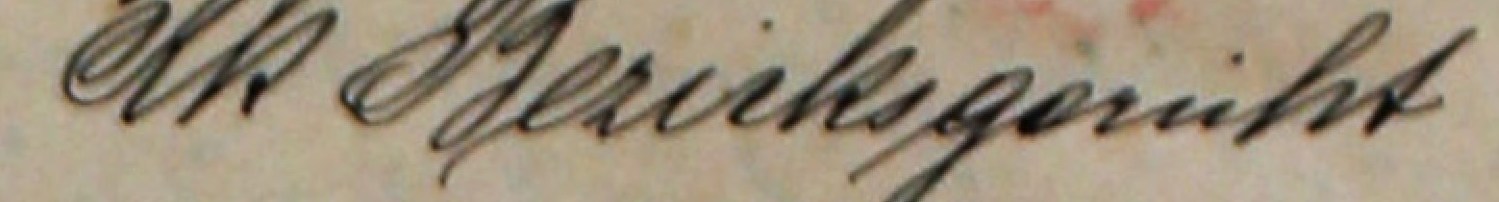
Kk Bezirksgericht
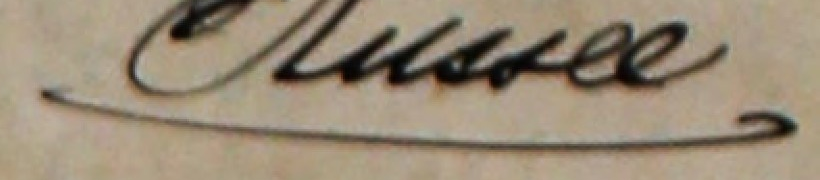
Aussee
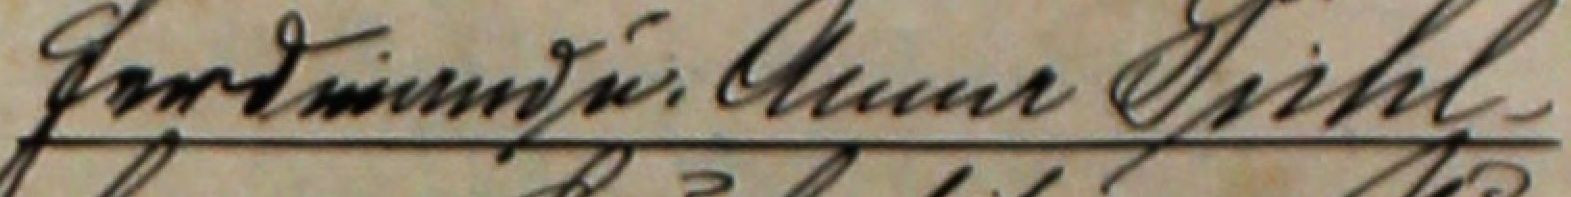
Ferdinand u. Anna Pichl-
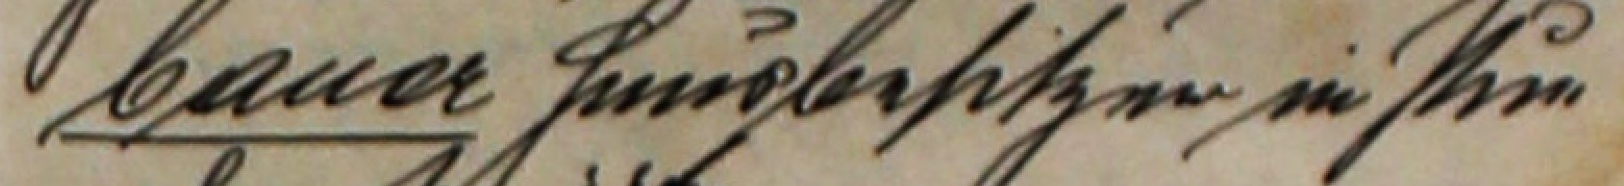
bauer Hausbesitzer in Pu„
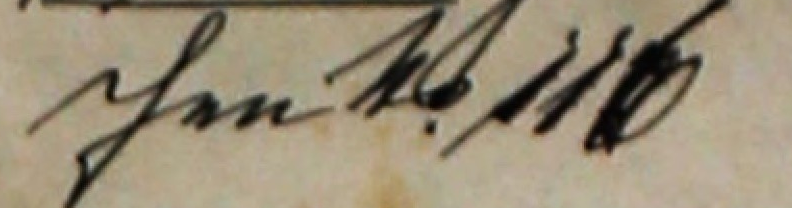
chen No 116
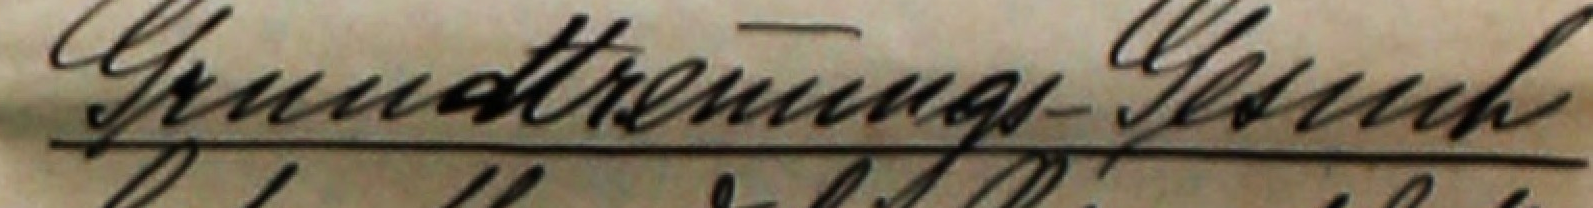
Grundtrennungs-Gesuch
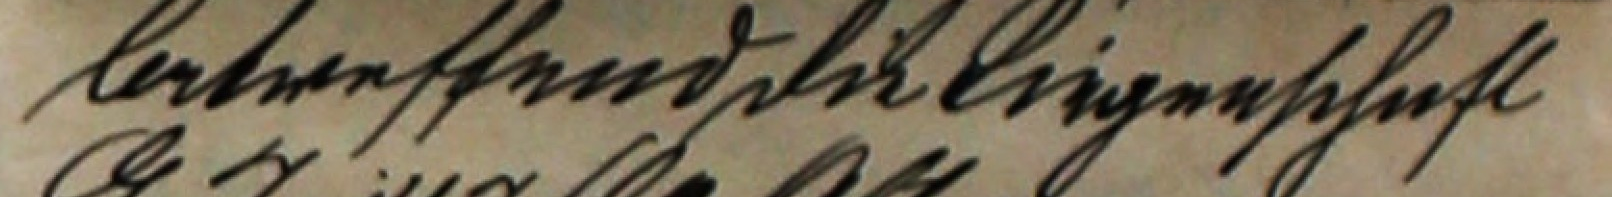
betreffend die Biegenschaft
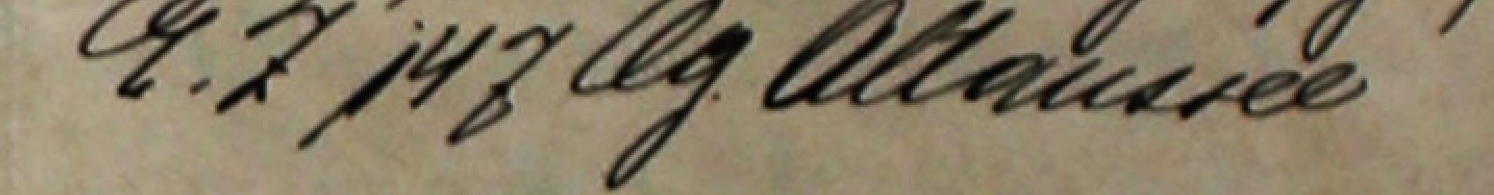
G.T. 147 Cg. Altausse
